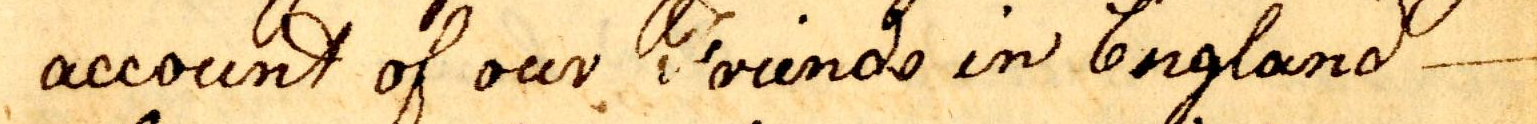account of our Friends in England-
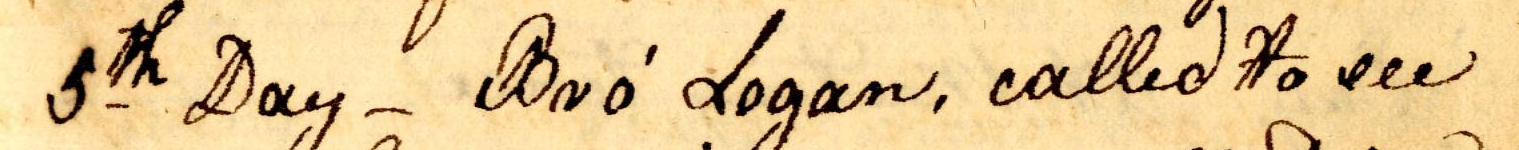5^th Day- Bro' Logan, called to see
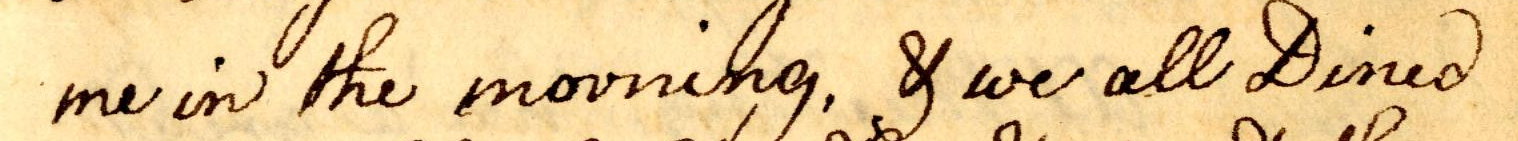me in the morning, & we all Dined
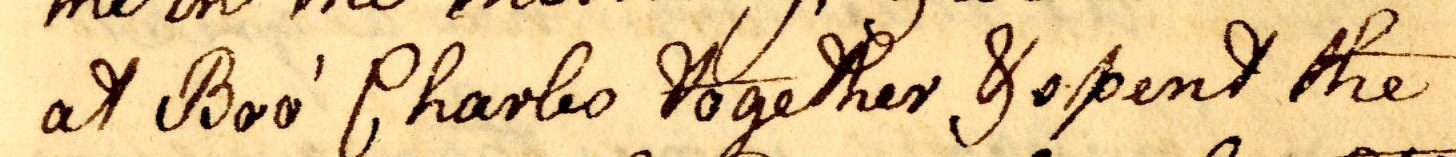at Bro' Charles together & spent the
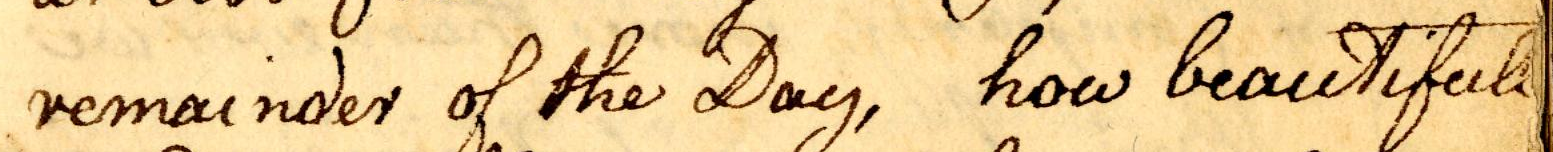remainder of the Day, how beautifull
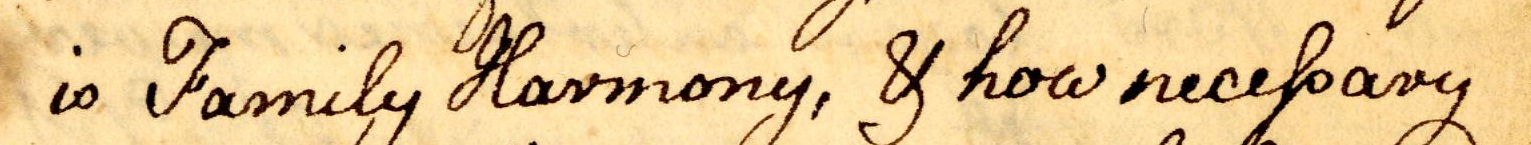is Family Harmony, & how necessary
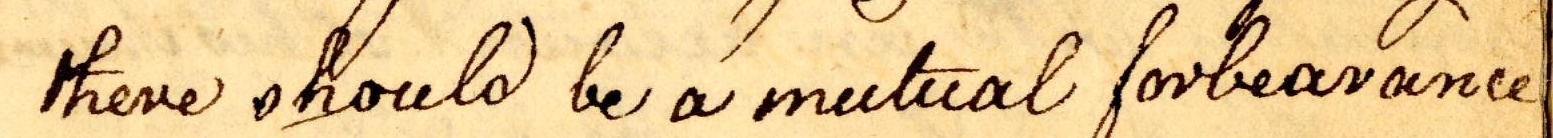there should be a mutual forbearance
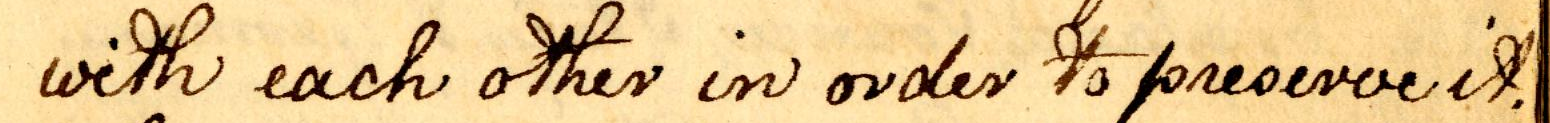with each other in order to preserve it.
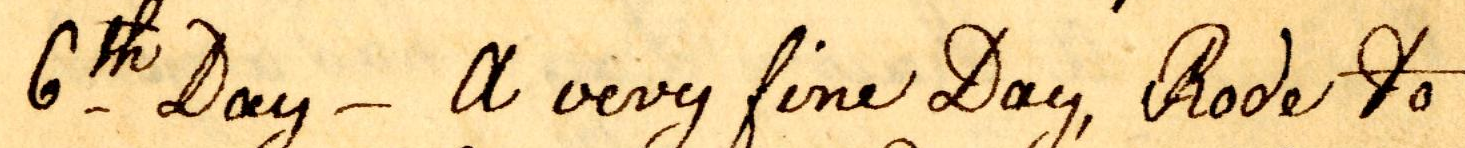6^th Day- A very fine Day, Rode to
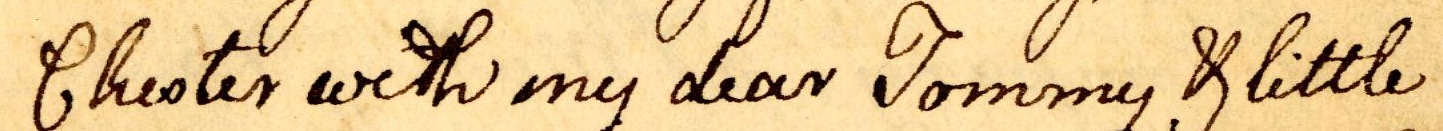Chester with my dear Tommy & little
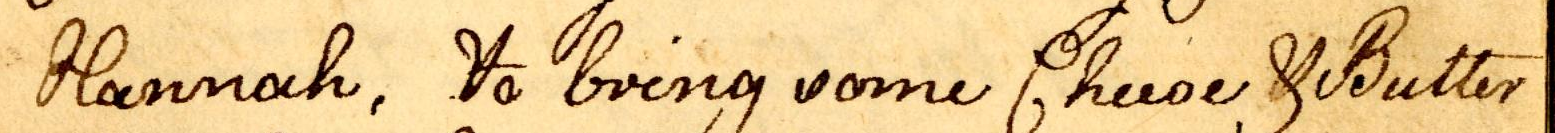Hannah, to bring some Cheese & Butter
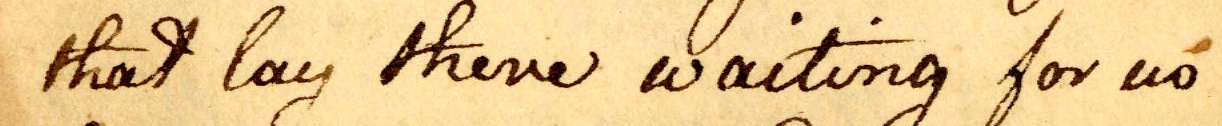that lay there waiting for us
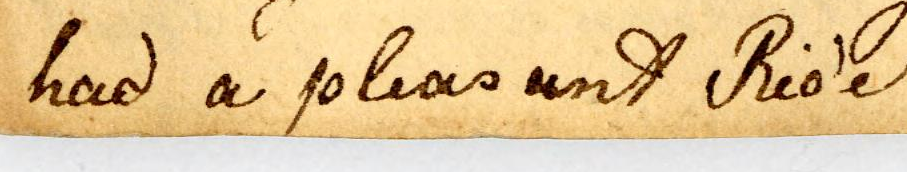had a pleasant Ride
